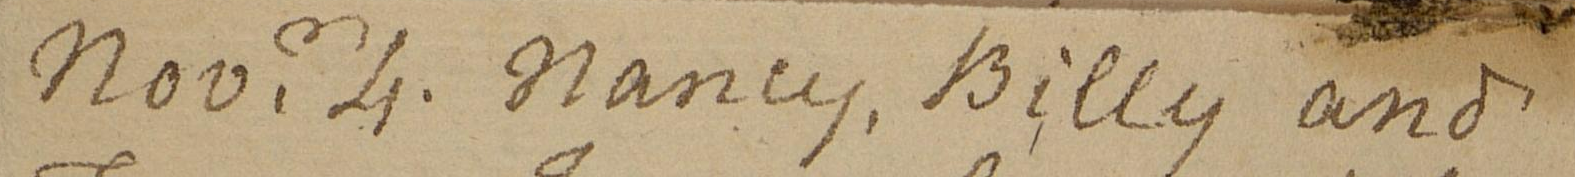Nov^r, 4. Nancy, Billy and
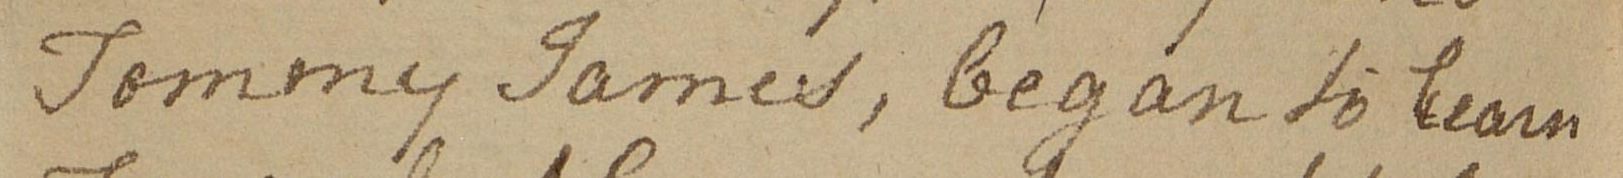Tommy James, began to learn
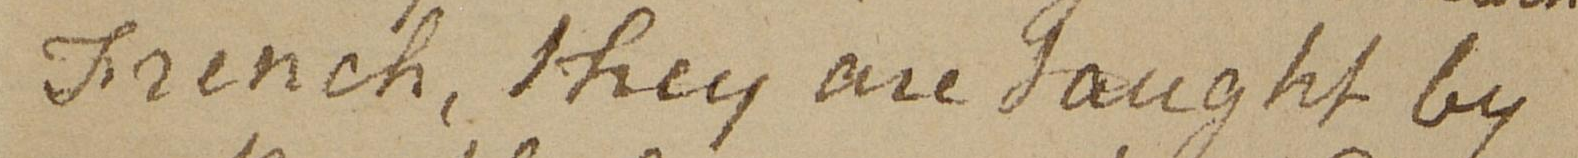French, they are taught by
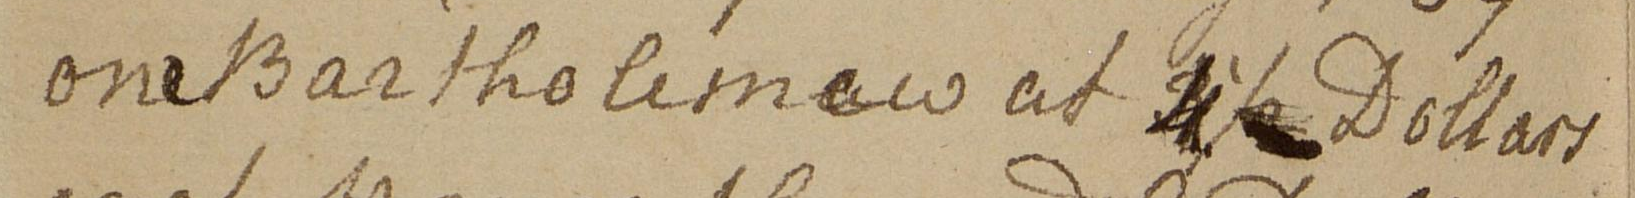one Bartholemew at 4 1/2 Dollars
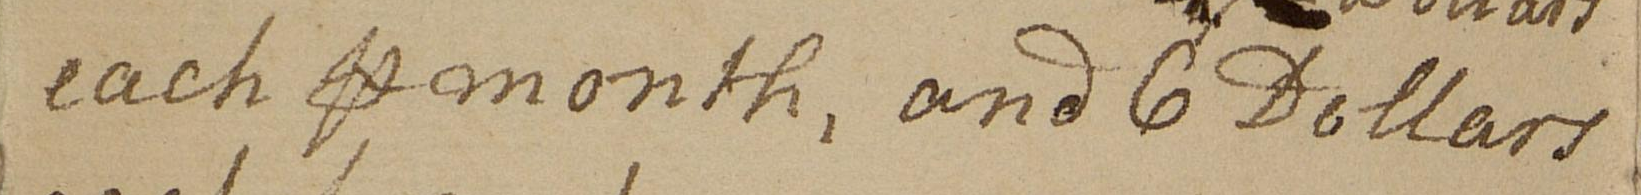each [per] month, and 6 Dollars
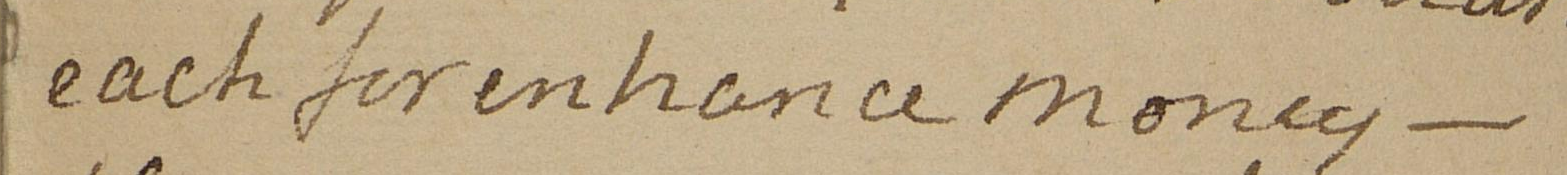each for entrance money-
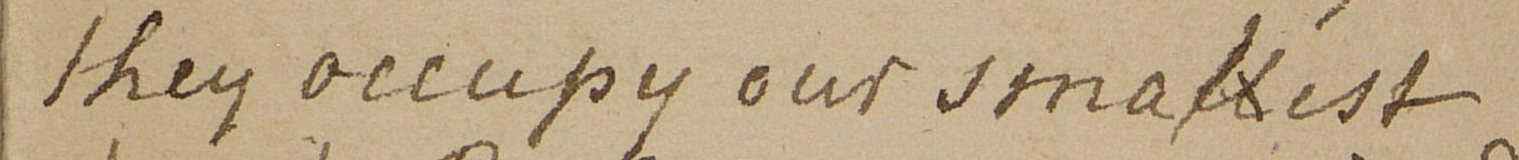they occupy our smallest
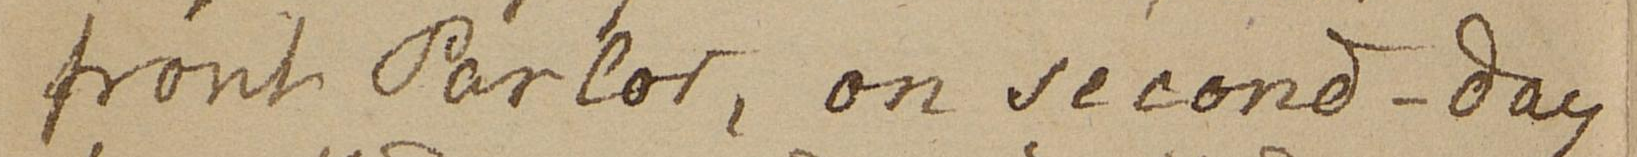front Parlor, on second- day
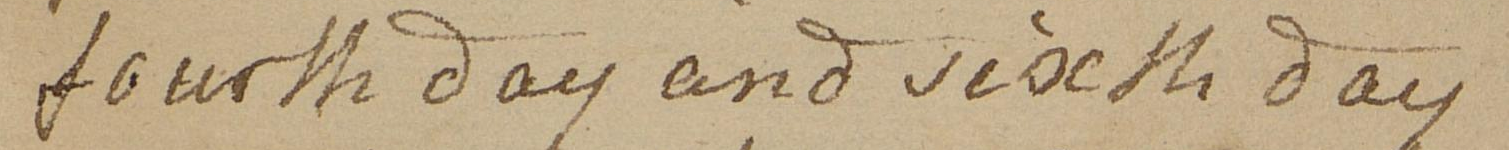fourth day and sixth day
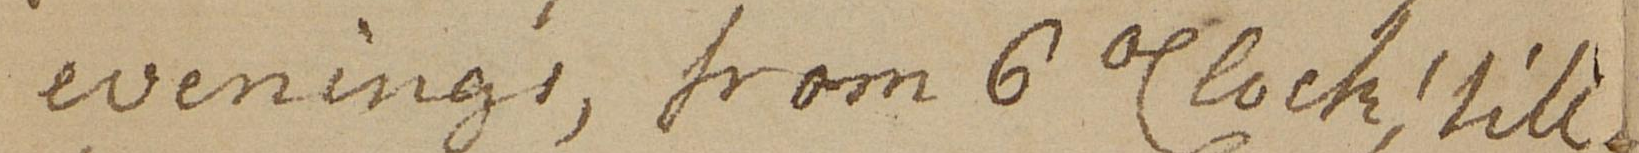evenings, from 6^o Clock 'till
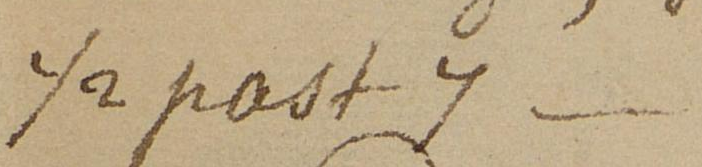1/2 past 7-
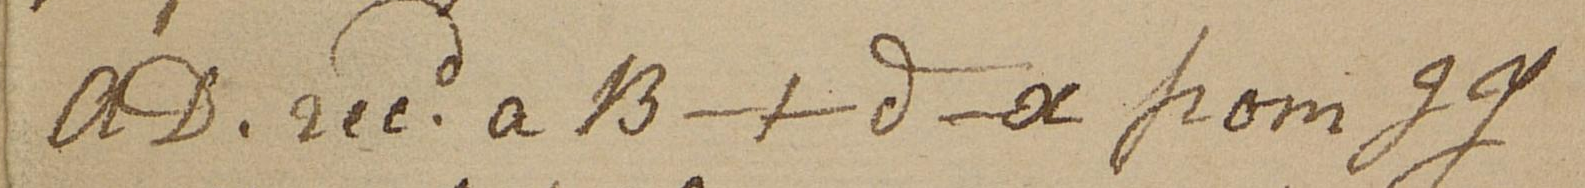AD. rec^d. a B--d-a from JJ
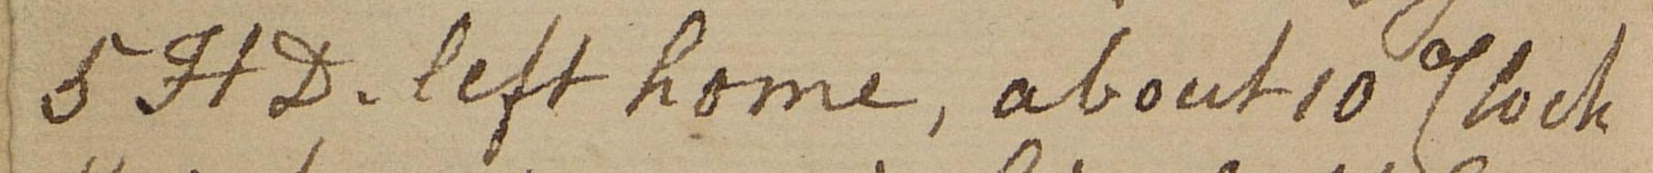5 HD- left home, about 10 ^o Clock
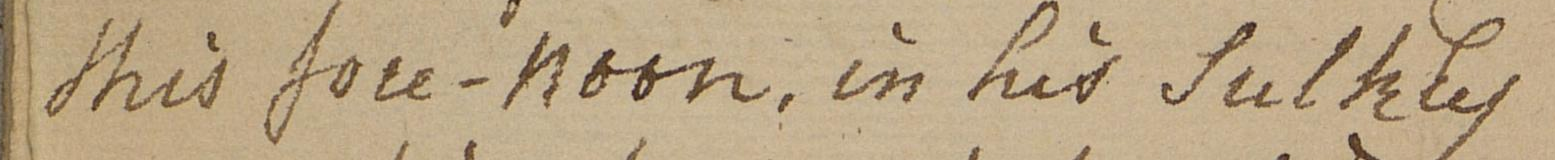this fore-noon, in his Sulkey
